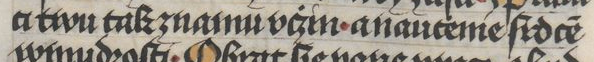ci twu tak znamu vcżin.a nauċenie ſrdcē
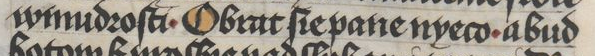wmudroſti.Obrat ſie pane nyeco.a bud
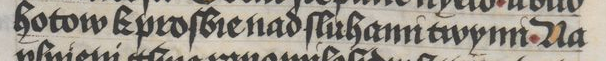hotow k proſbie nad ſluhami twymi.Na
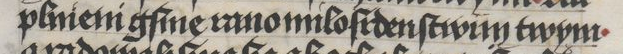plnieni gſme rano miloſrdenſtwim twym.
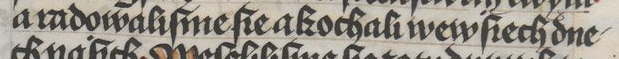a radowaliſme ſie akochali wewſiech dne¬
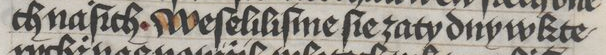ch naẛich.Weſeliliſme ſie zaty dny wkte¬
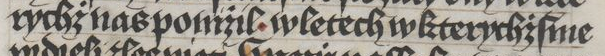rychż nas poniżil.wletech wkterychż ſme
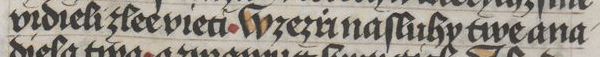vidieli zlee vieci.Wzezṙi naſluhy twe a na
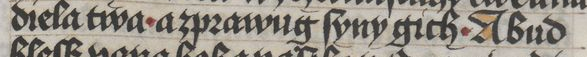diela twa.a zprawug ſyny gich.A bud
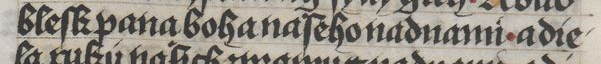bleſk pana boha naẛeho nadnami.a die¬
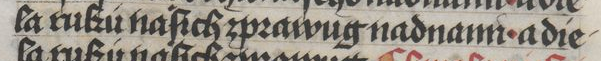la ruku naẛich zprawug nadnami.a die¬
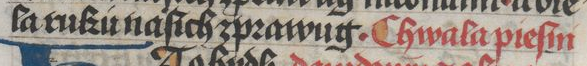la ruku naẛich zprawug.Chwala pieſni
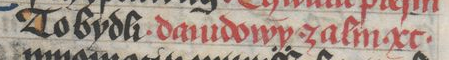To bydli.dauidowy.zalm.xc.
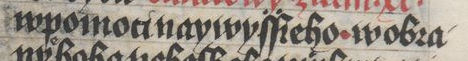wpomoci naywyẛẛieho.w obra¬
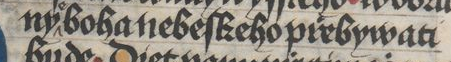ny boha nebeſkeho pṙebywati
